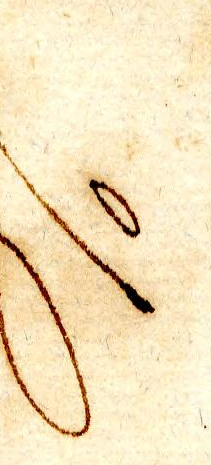To
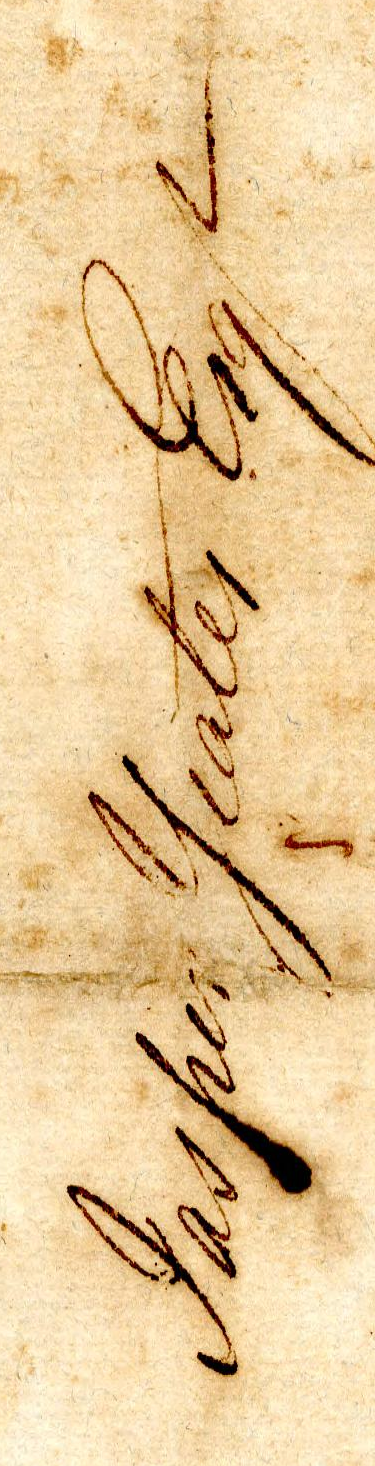Jasper Yeates Esq^r
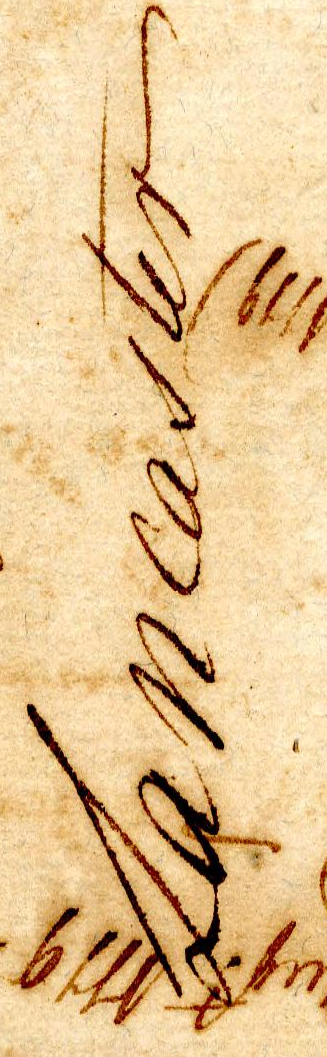Lancaster
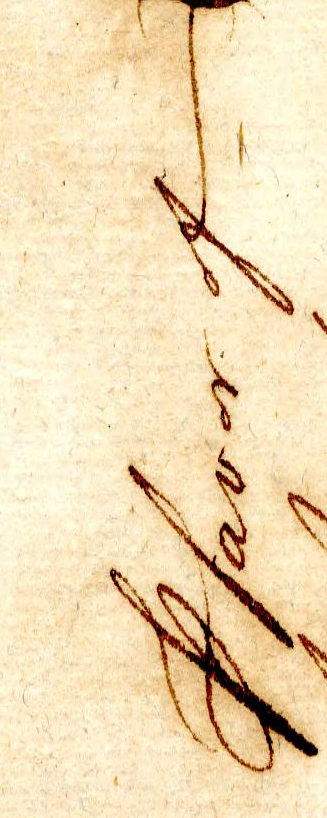Per favor of
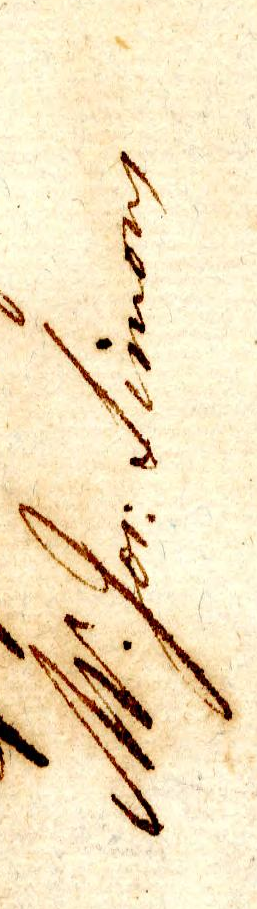W. Jos: Simons
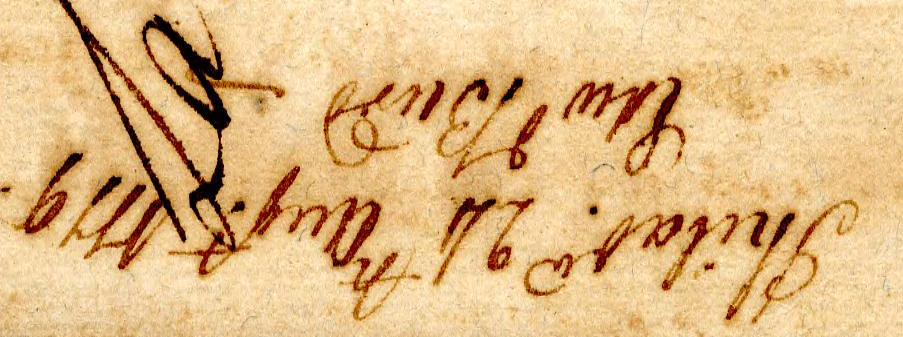Phlilad^a. 24^th Aug^t. 1779
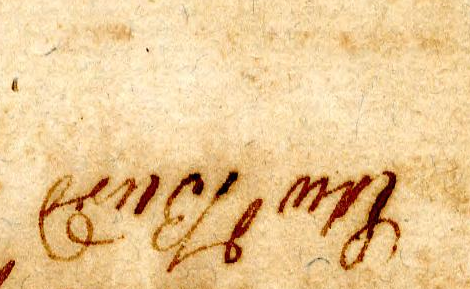Edw^d. Burd
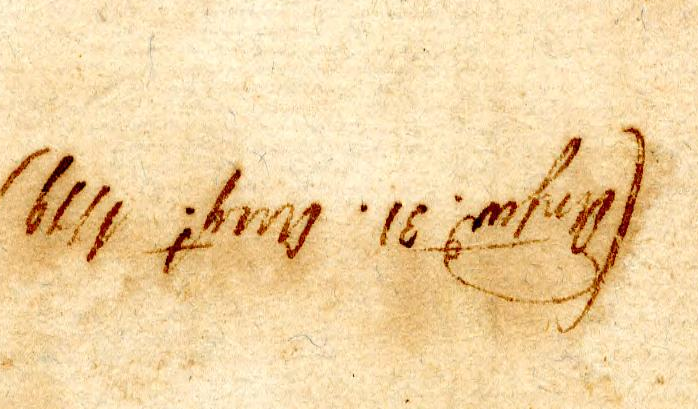(Answ'd. 31. Aug^t. 1779)
